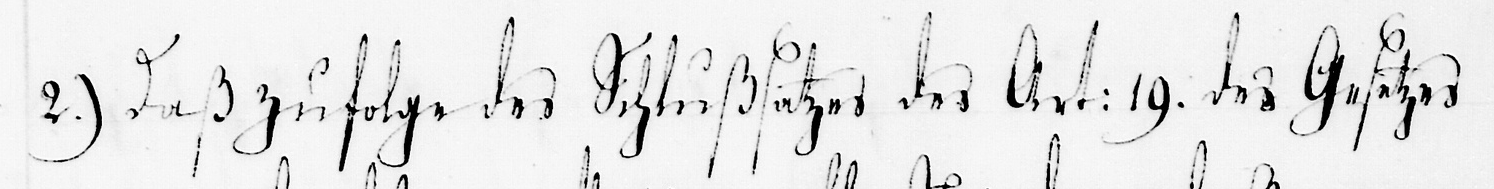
2.) Daß zufolge des Schlußsatzes des Art: 19. des Gesetzes
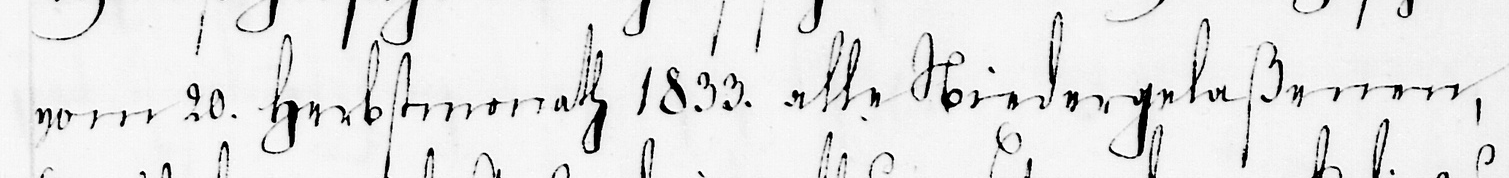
vom 20. Herbstmonath 1833. alle Niedergelaßenen,
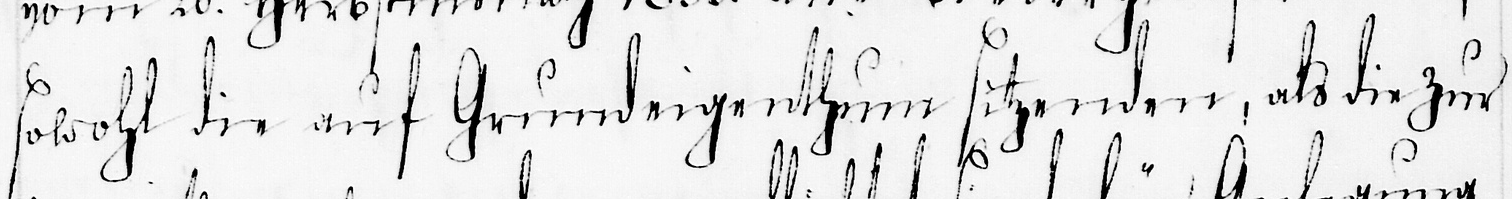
sowohl die auf Grundeigenthum sitzenden, als die zur
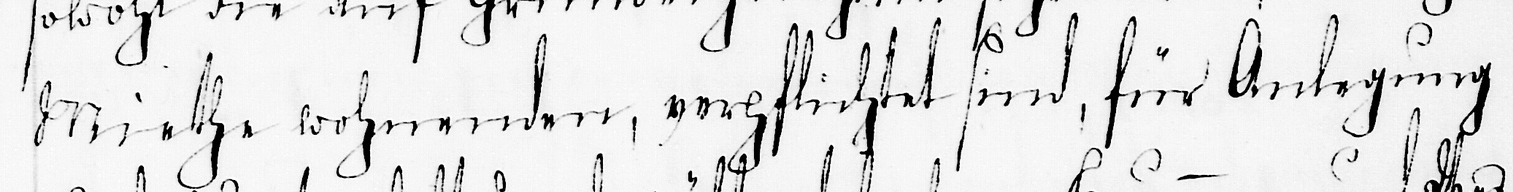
Miethe wohnenden, verpflichtet sind, für Anlegung
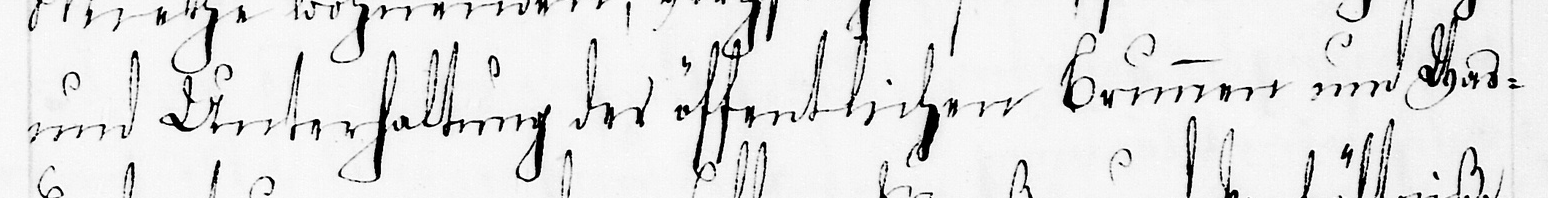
und Unterhaltung der öffentlichen Brunnen und Waß¬
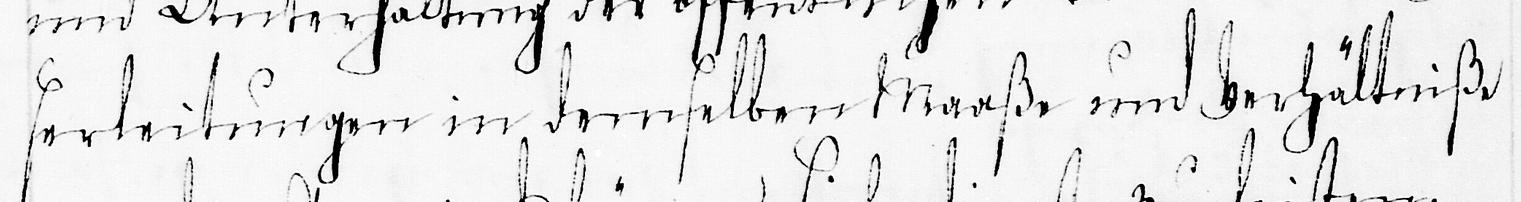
erleitungen in demselben Maaße und Verhältniße
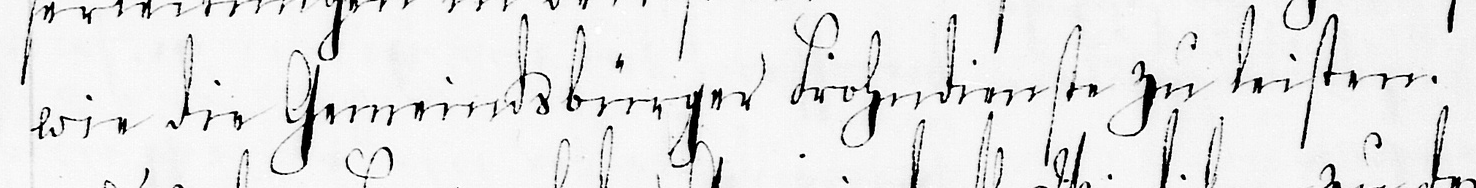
wie die Gemeindsbürger Frohndienste zu leisten.
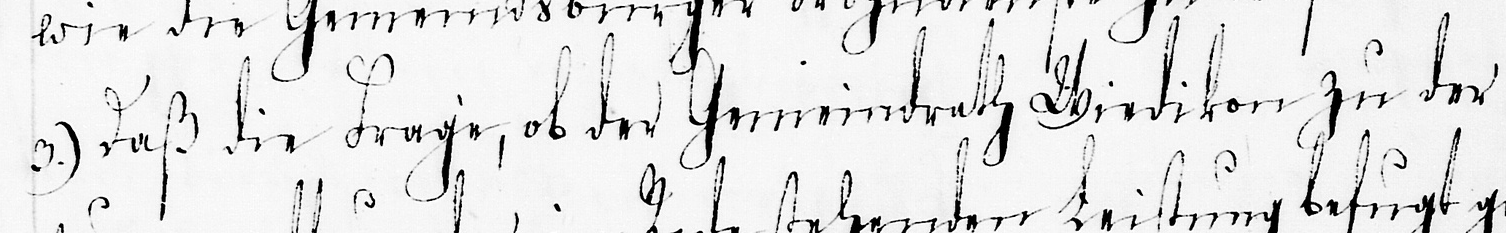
3.) Daß die Frage, ob der Gemeindrath Wiedikon zu der
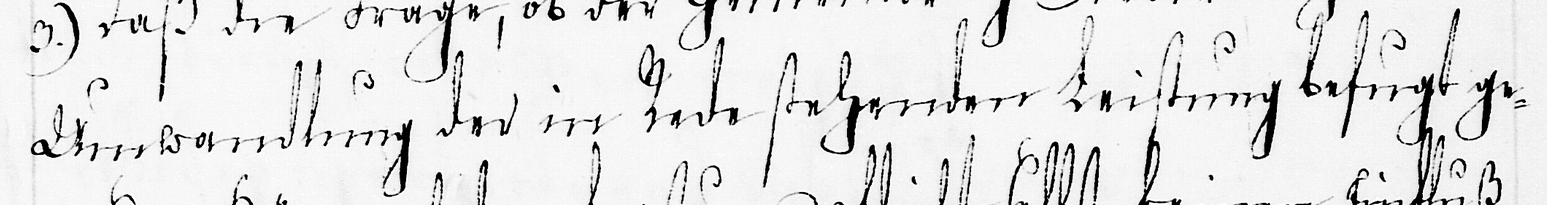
Umwandlung der in Rede stehenden Leistung befugt ge¬
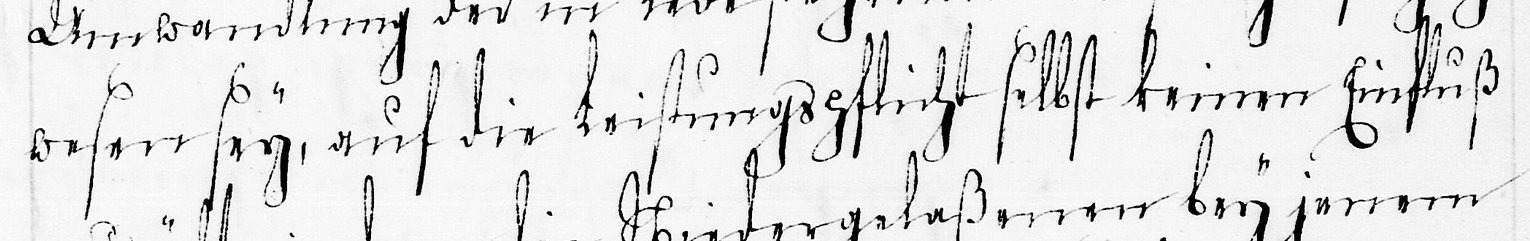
wesen sey, auf die Leistungspflicht selbst keinen Einfluß
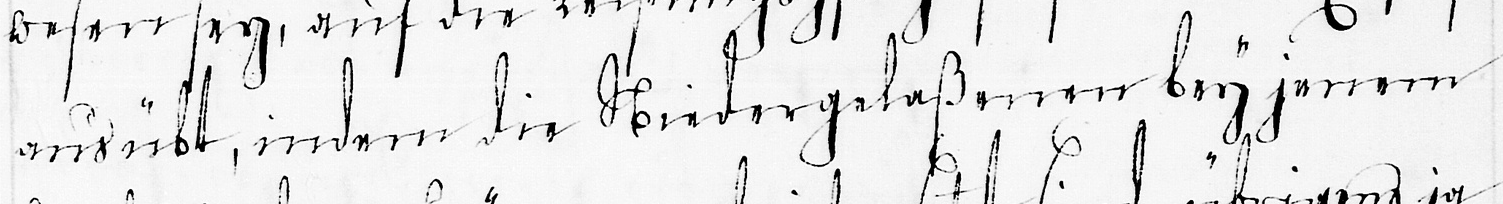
ausübt, indem die Niedergelaßenen bey jenem
